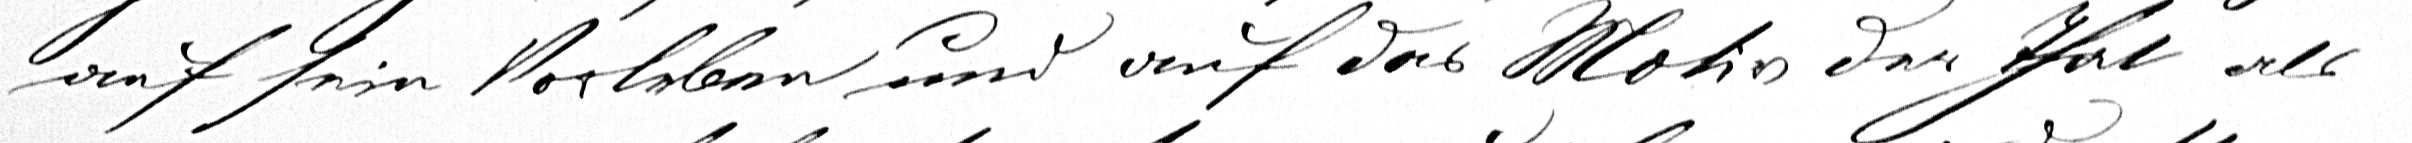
auf sein Vorleben und auf das Motiv der That als
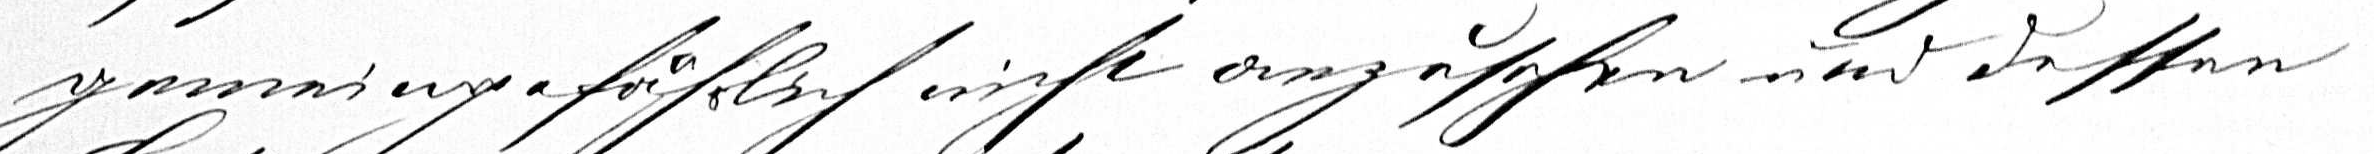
gemeingefährlich nicht anzusehen und dessen
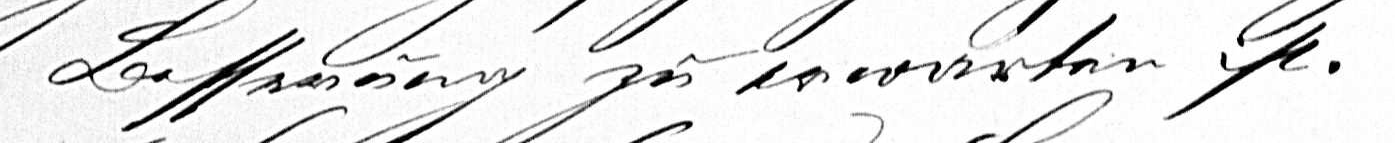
Besserung zu erwarten ist.
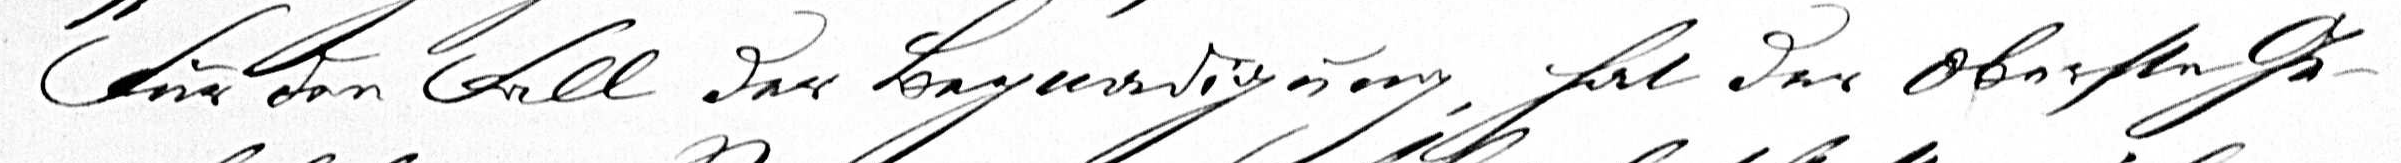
Für den Fall der Begnadigung, hat der Obersten Ge¬
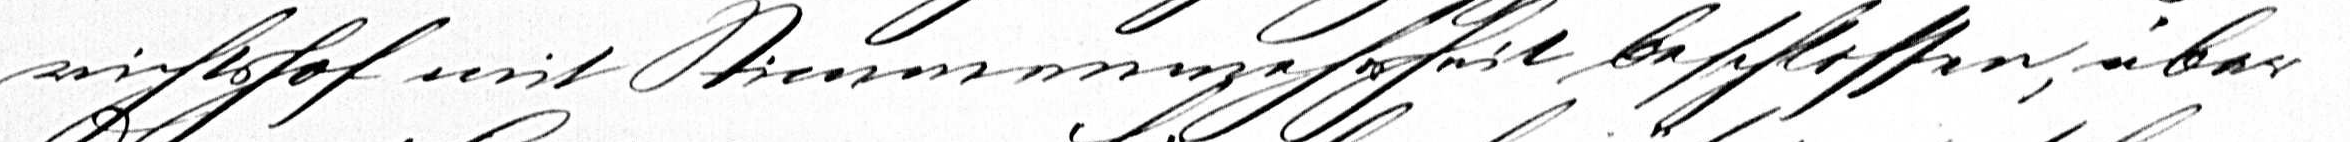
richtshof mit Stimmenmehrheit beschlossen, über
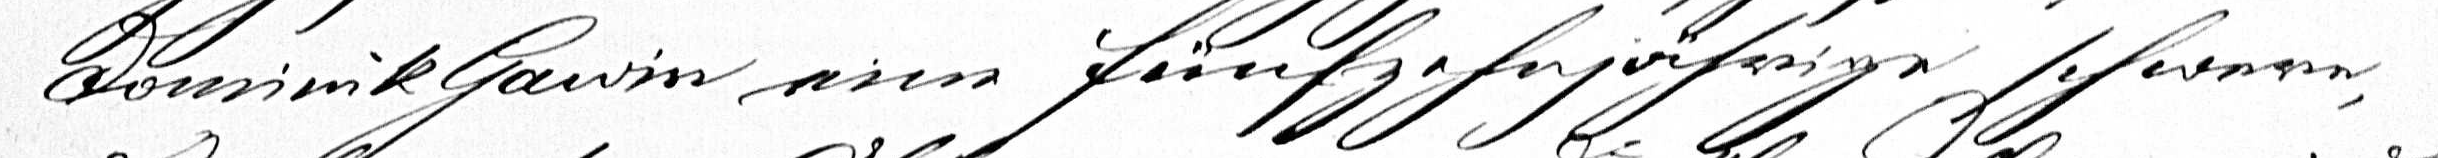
Dominik Gawin eine fünfzehnjährige schwere
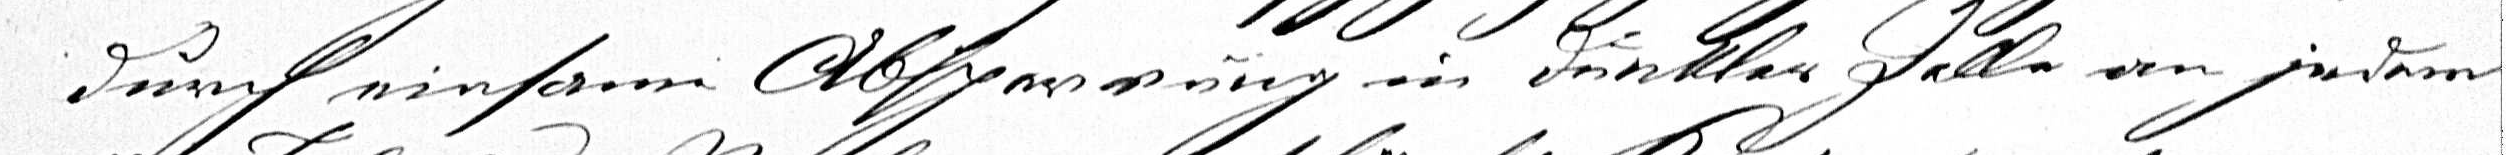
durch einsame Absperrung in dunkler Zelle an jedem
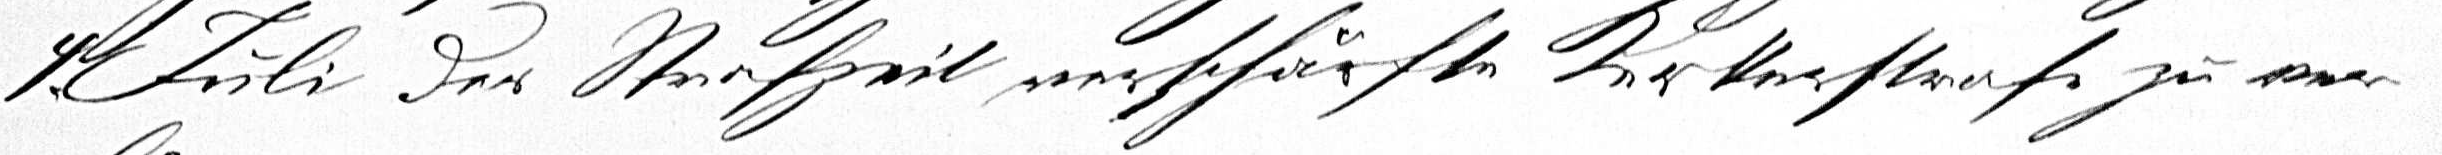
4. Juli der Strafzeit verschärfte Kerkerstrafe zu ver¬
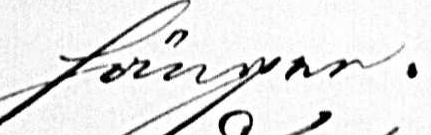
hängen.
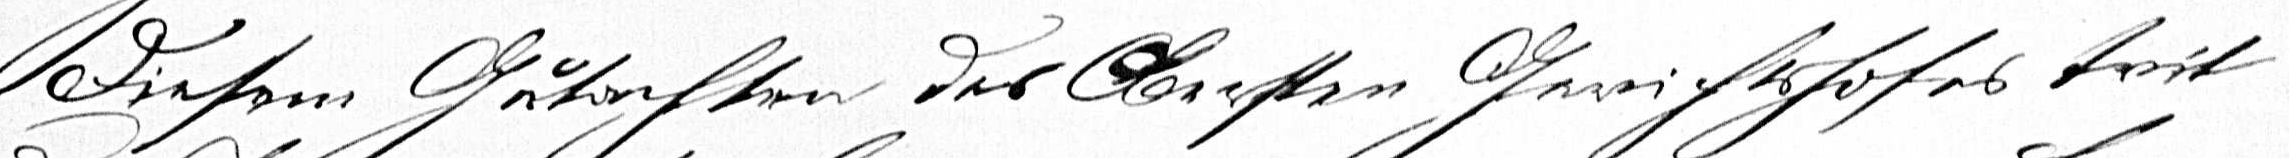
Diesem Gutachten des Obersten Gerichtshofes trit
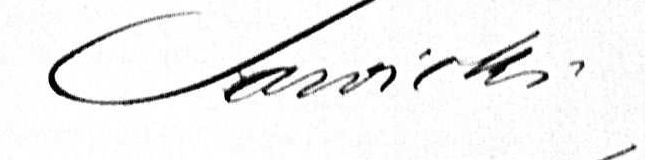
Jawicki
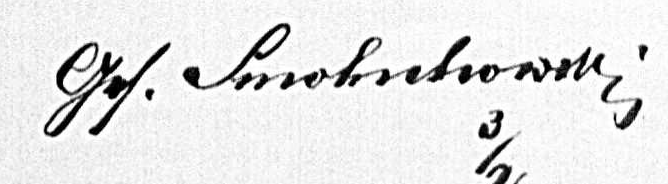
Grf Smolenkowski
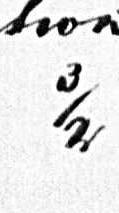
3/2
